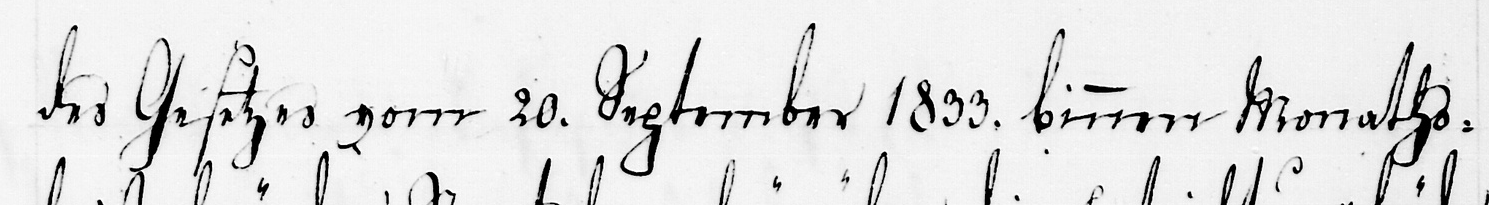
des Gesetzes vom 20. September 1833. binnen Monaths¬
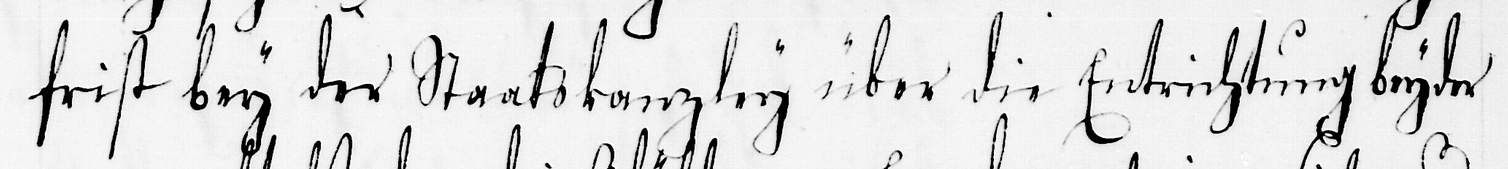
frist bey der Staatskanzley über die Entrichtung beyder
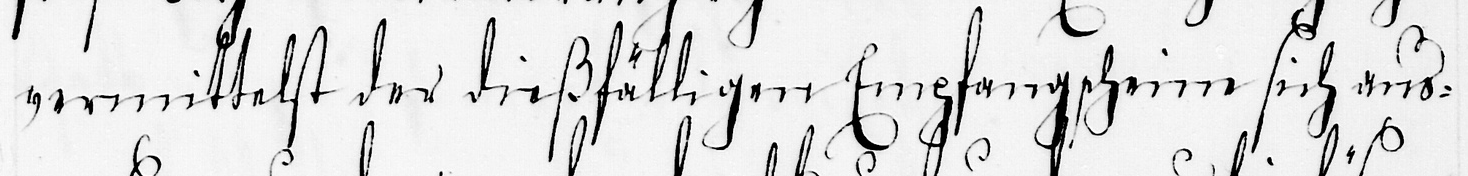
vermittelst der dießfälligen Empfangscheine sich aus¬
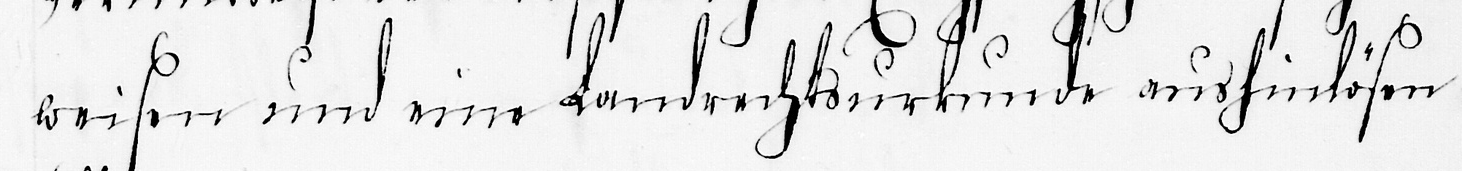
weisen und eine Landrechtsurkunde aushinlösen
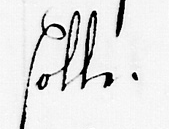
solle.
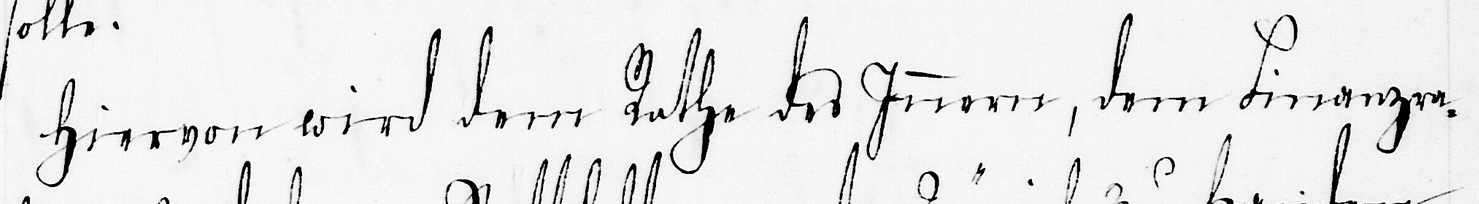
Hiervon wird dem Rathe des Innern, dem Finanzra¬
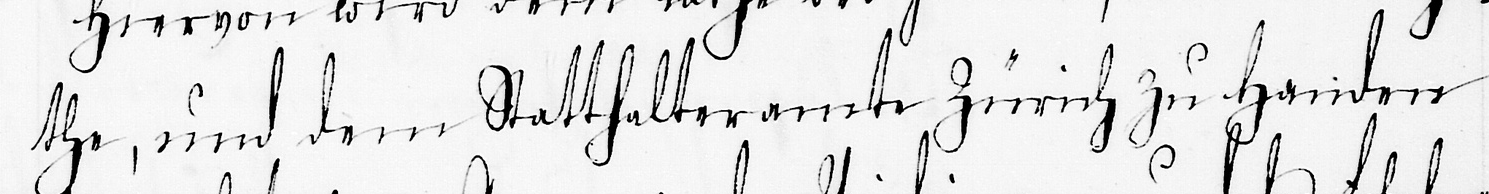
the, und dem Statthalteramte Zürich zu Handen
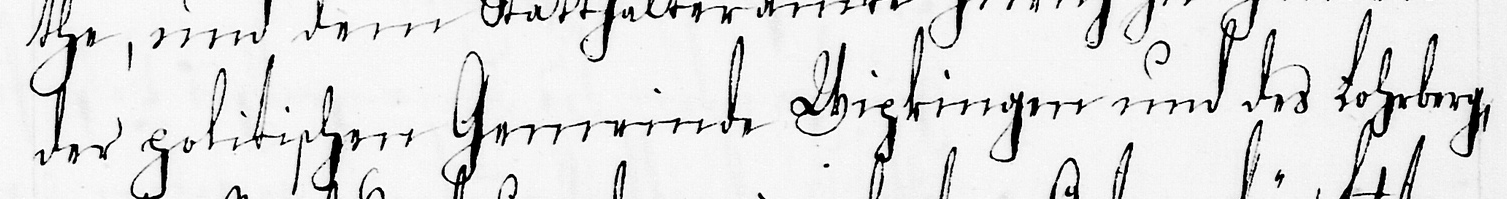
der politischen Gemeinde Wipkingen und des Lohrber¬
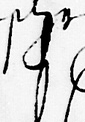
2.)
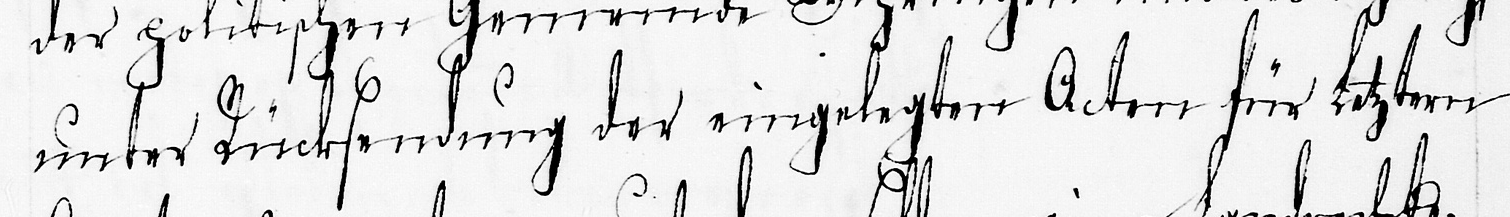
unter Rücksendung der eingelegten Acten für Letztern
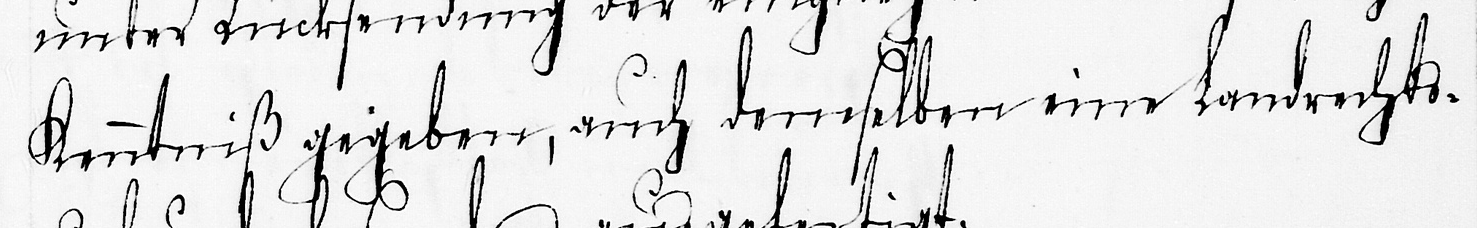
Kenntniß gegeben, auch demselben eine Landrechts¬
